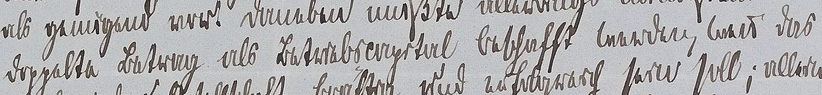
doppelte Betrag als Betriebscapital beschafft werden, wenn das
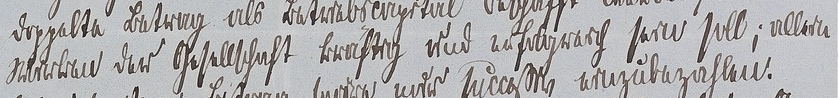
Wirken der Gesellschaft kräftig und erfolgreich sein soll; allein
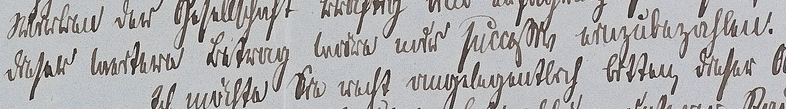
dieser weitere Betrag wäre nur successiv einzubezahlen.
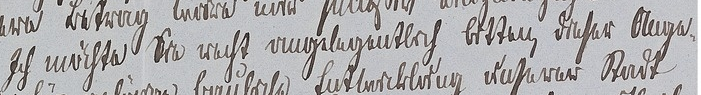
Ich möchte Sie recht angelegentlich bitten, dieser Ange-
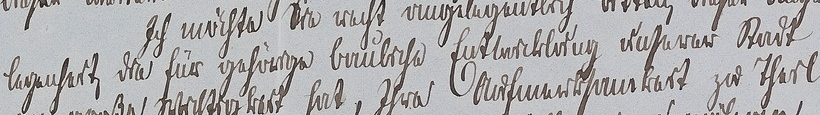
legenheit, die für gehörige bauliche Entwicklung unserer Stadt
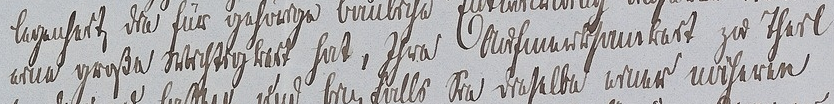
eine große Wichtigkeit hat, Ihre Aufmerksamkeit zu Theil
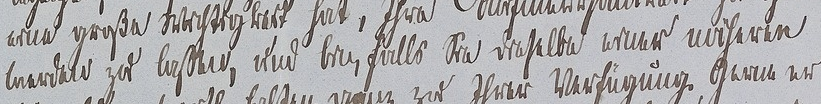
werden zu lassen, und bin, falls Sie dieselbe einer näheren
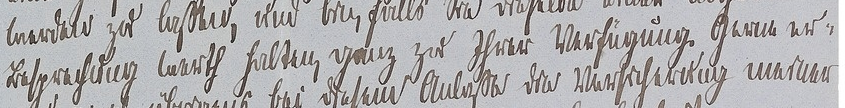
Besprechung werth halten, ganz zu Ihrer Verfügung. Gerne er-
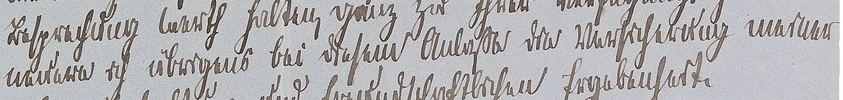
neuere ich übrigens bei diesem Anlasse die Versicherung meiner
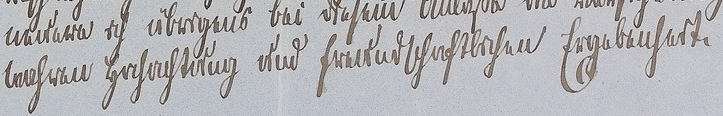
wahren Hochachtung und freundschaftlichen Ergebenheit.
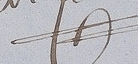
Escher
